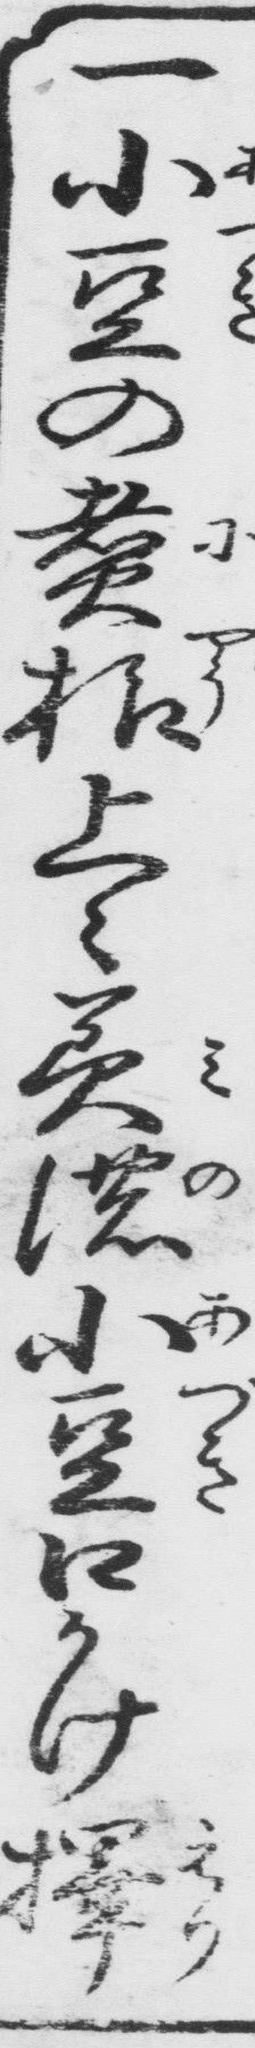一小豆の煮様上々美濃小豆口かけ択

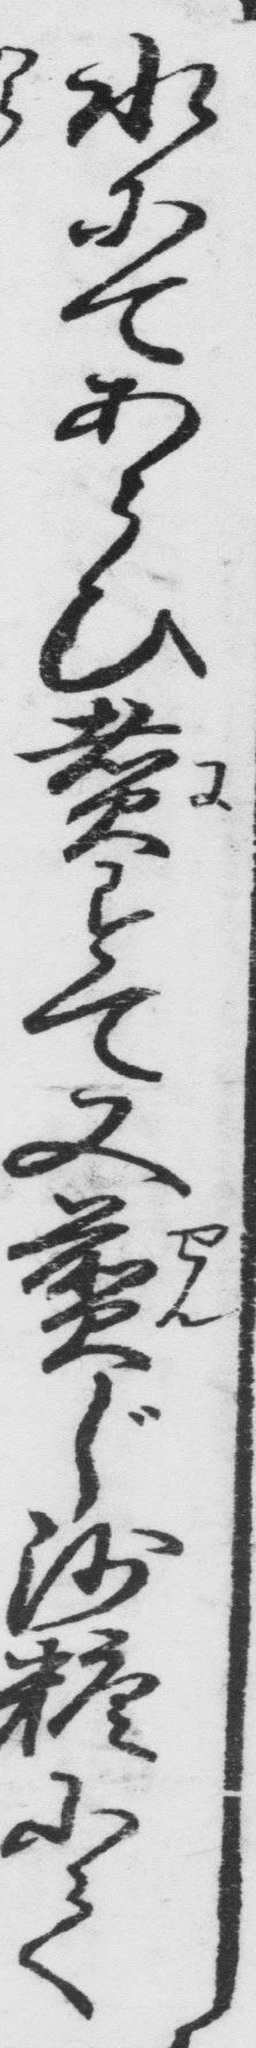水にてあらひ煮すて又煎じ沙糖にて
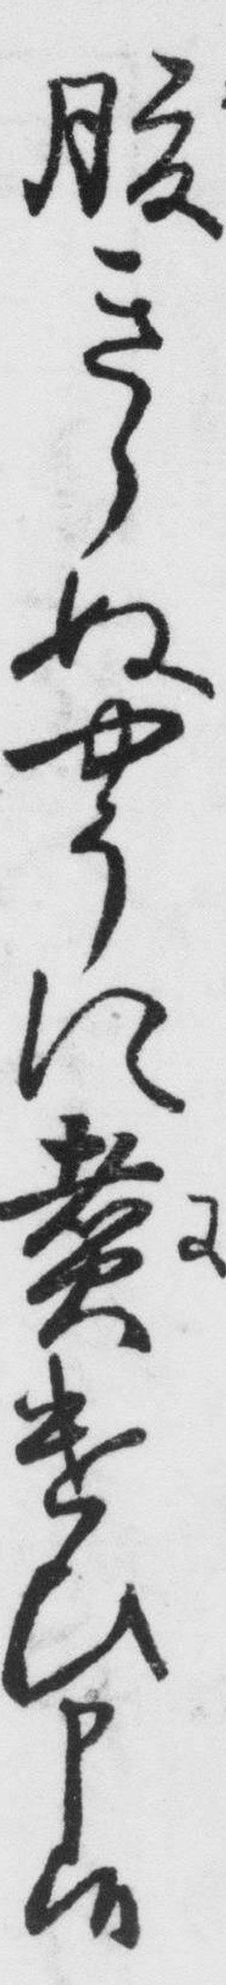腹きらぬやうに煮遣ひ申候
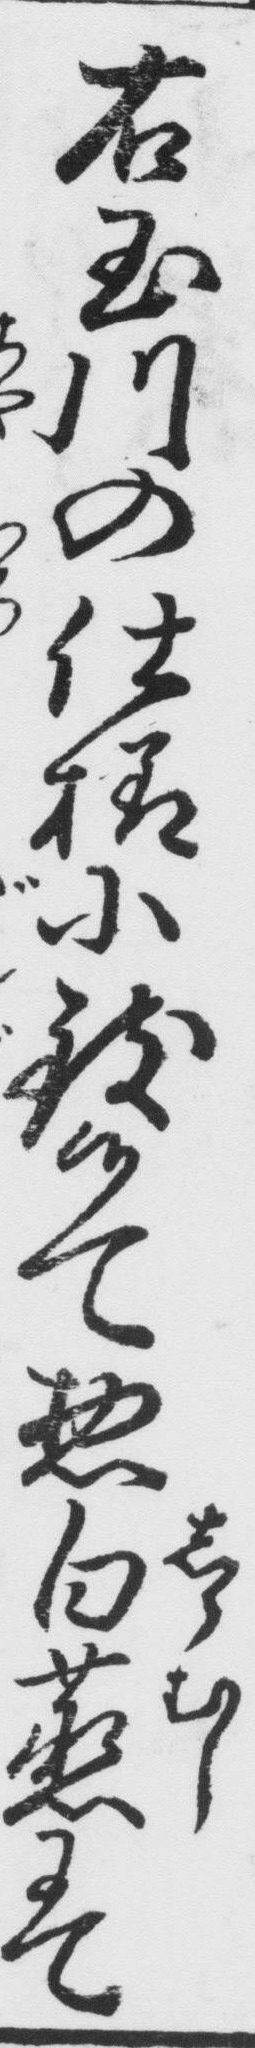右玉川の仕様に致候て惣白蒸にて
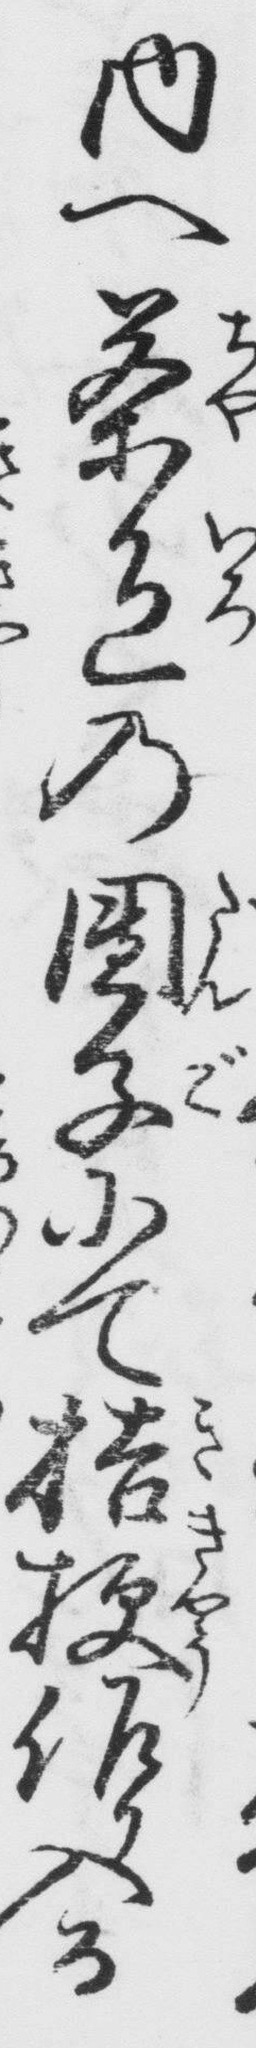内へ茶色の団子にて桔梗作り入る
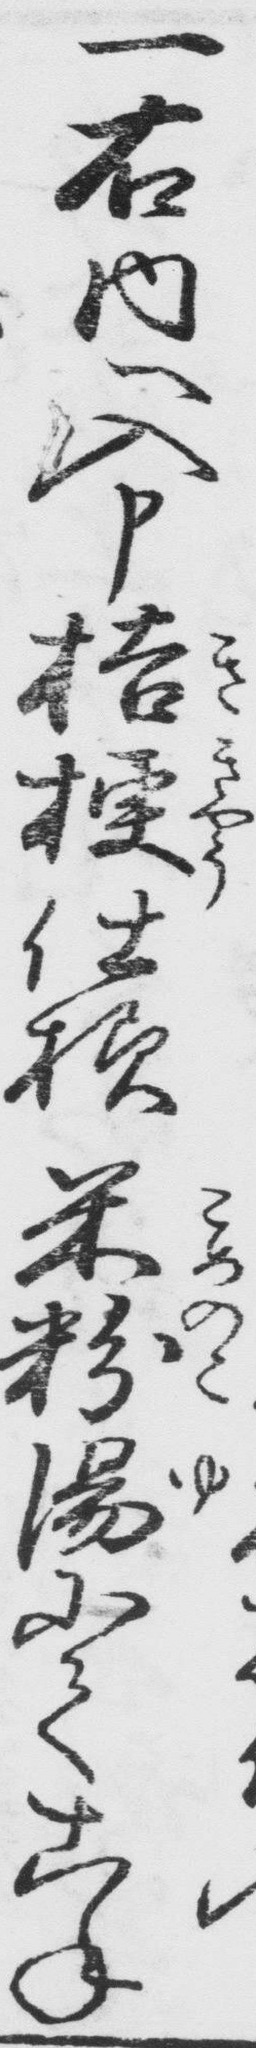一右内へ入申桔梗仕様米粉湯にてこね
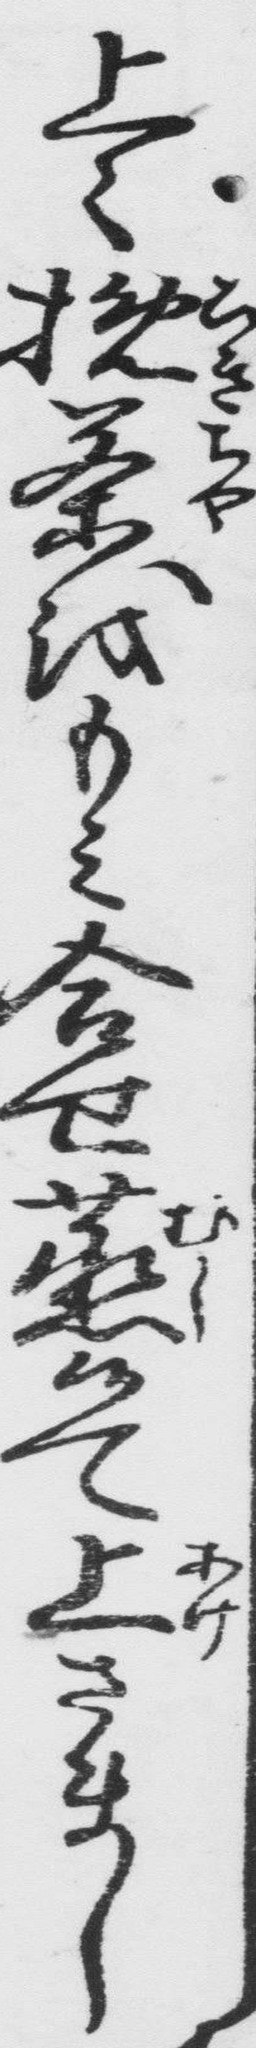上々挽茶をもみ合せ蒸候て上さまし
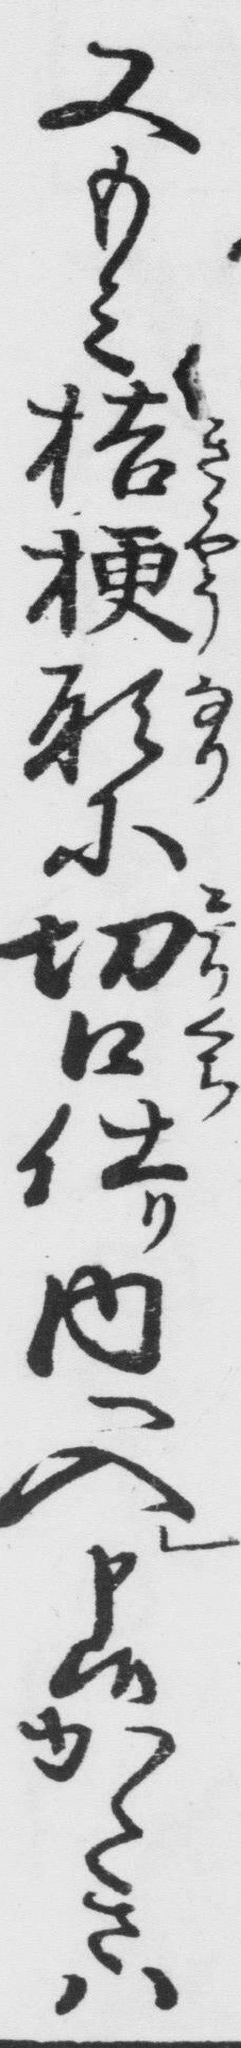又もみ桔梗形に切口仕り内へ入れ申候かたさは
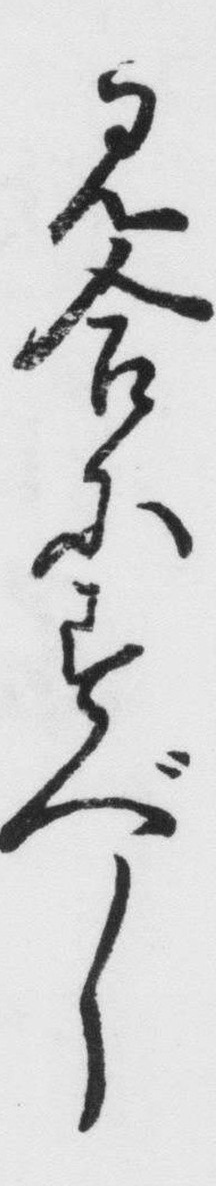見合にすべし
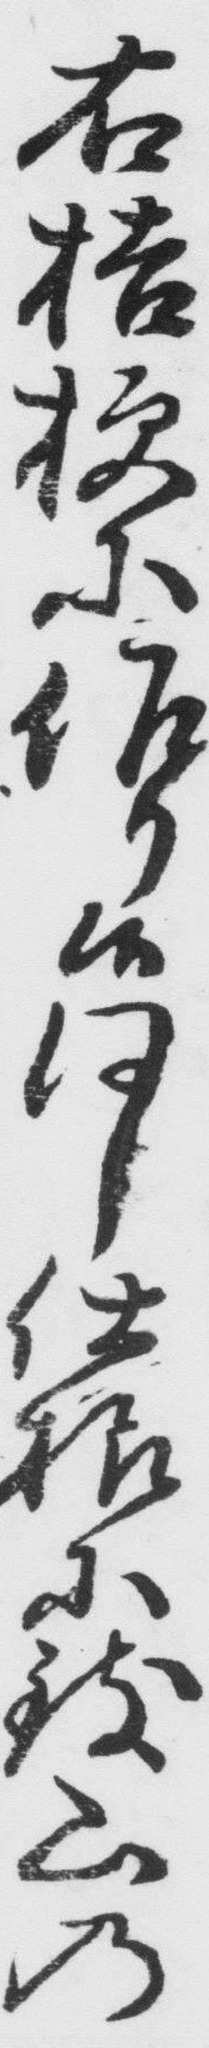右桔梗に作り候同し仕様に致山の
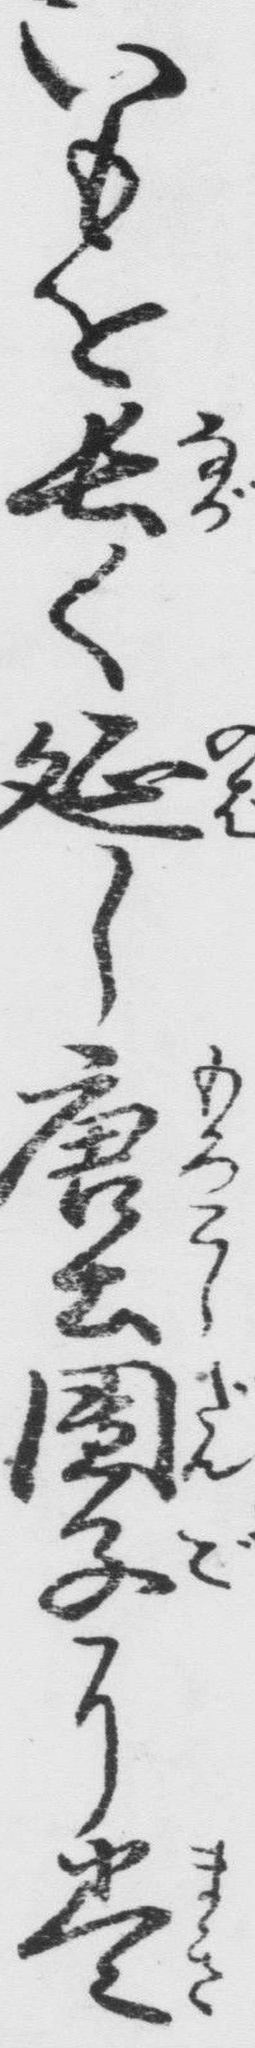いもを長く延し唐土団子に巻
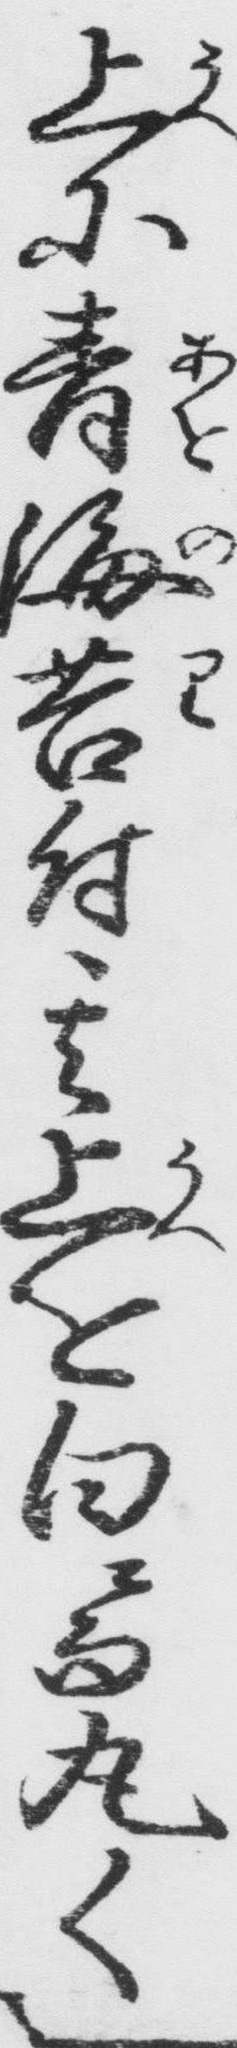上に青海苔付其上を白にて丸く

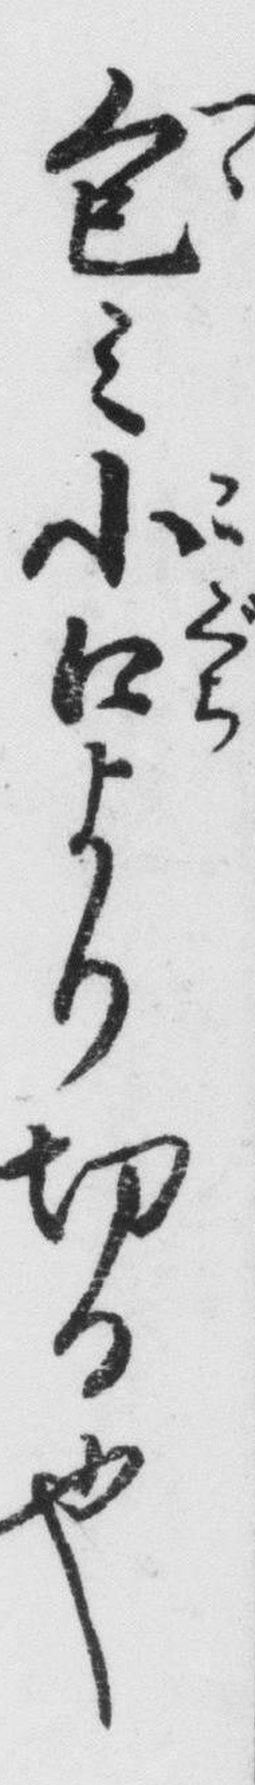包み小口より切る也
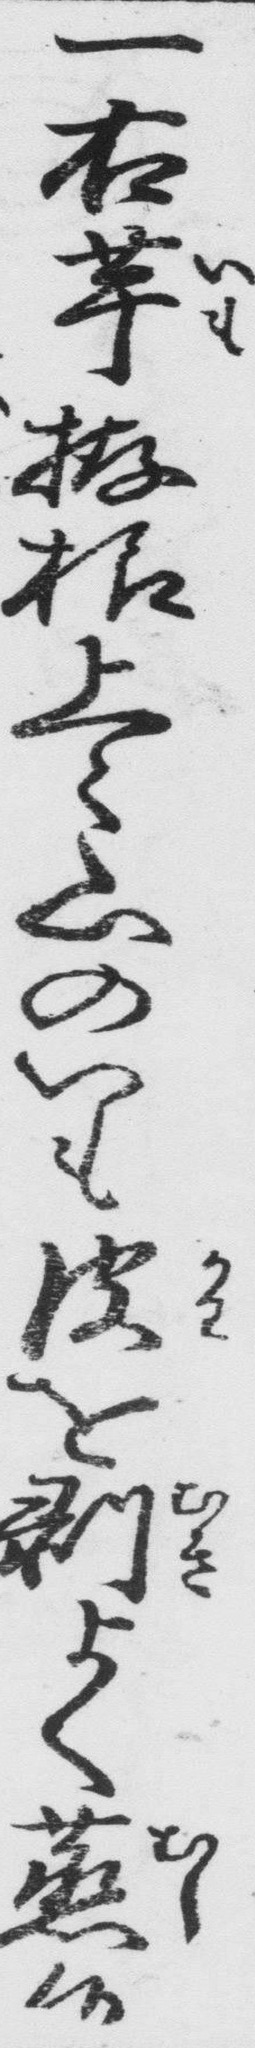一右芋拵様上々山のいも皮を剥よく蒸候
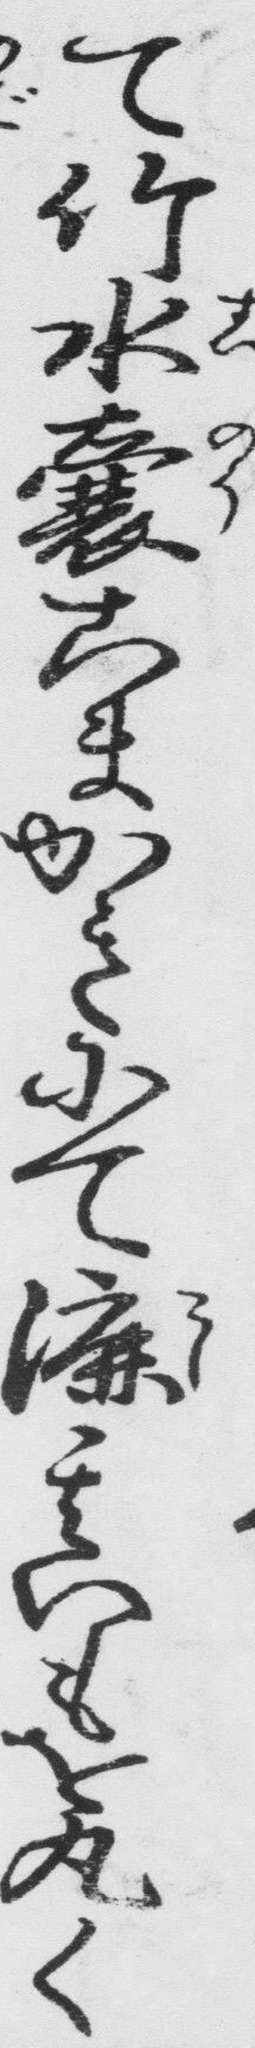て竹水嚢こまかきにて漉其いもを丸く
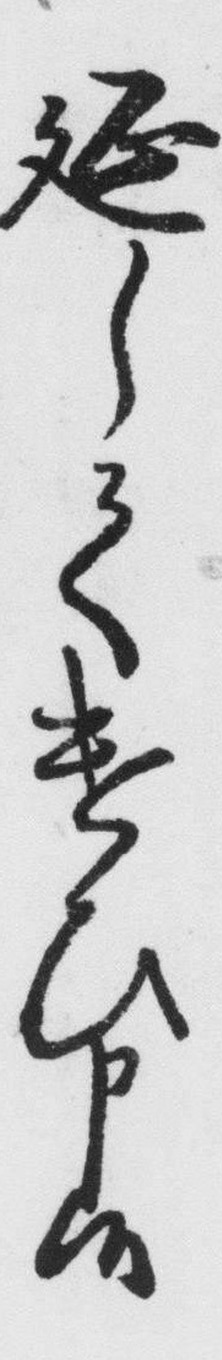延して遣ひ申候
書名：御前菓子図式
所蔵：大阪府立大学学術情報センター 国文学研究資料館
